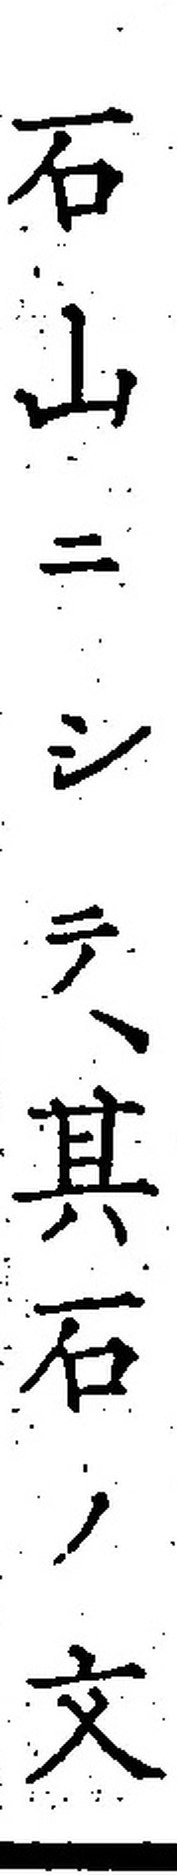石山ニシテ、其石ノ文
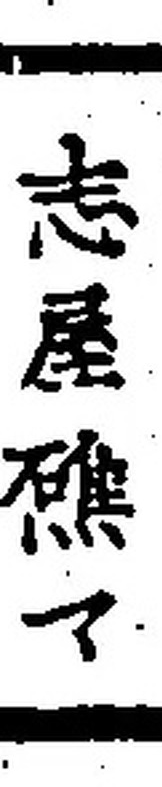志屋礁マ

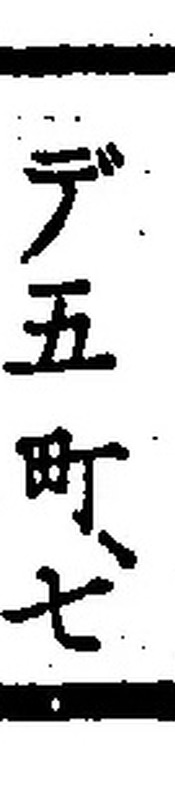デ五町、七
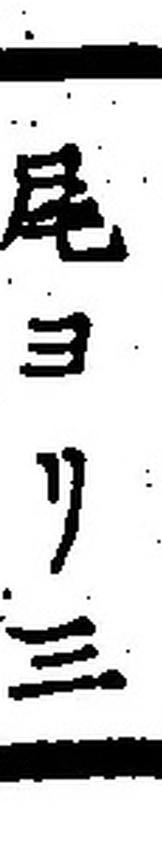尾ヨリ三
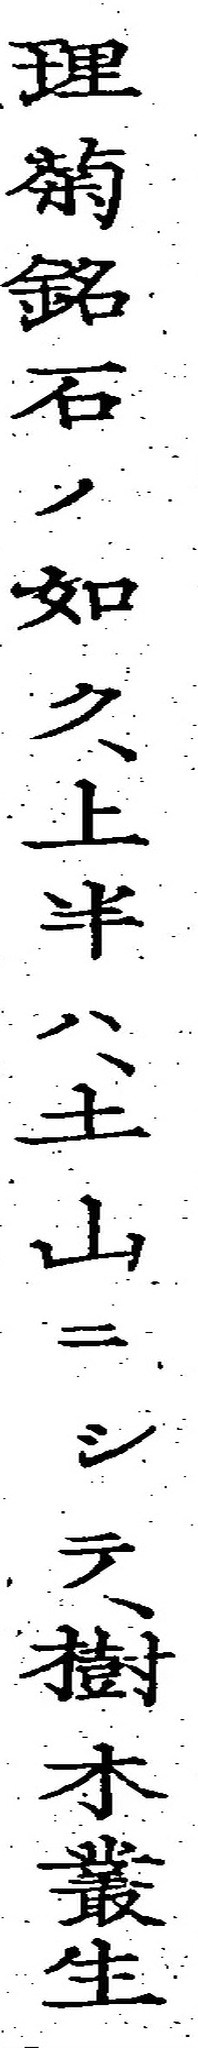理菊銘石ノ如ク、上半ハ、土山ニシテ、樹木叢生
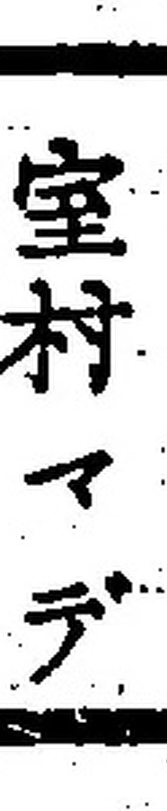室村マデ
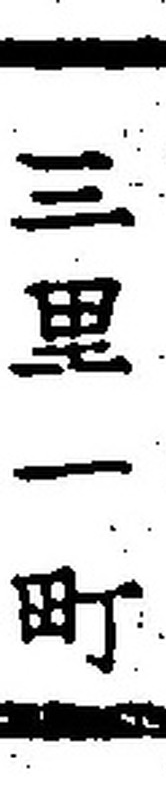三里一町
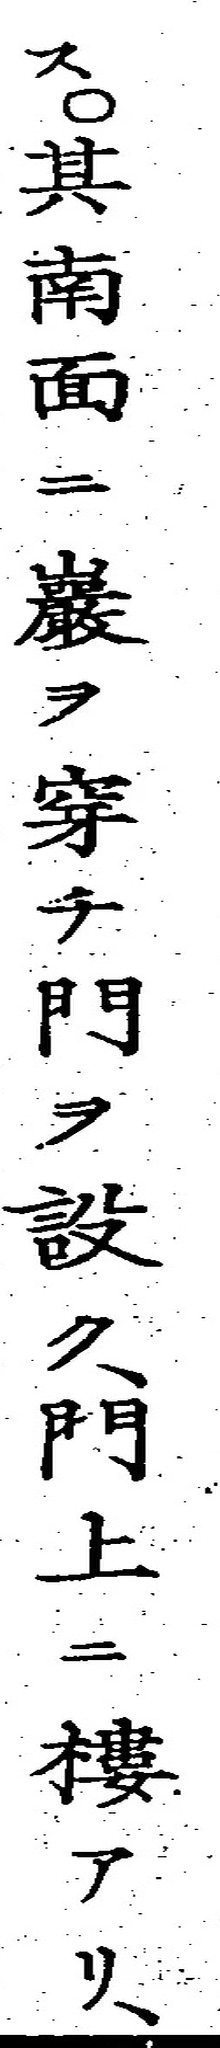ス。其南面ニ巌ヲ穿チ門ヲ設ク、門上ニ楼アリ、
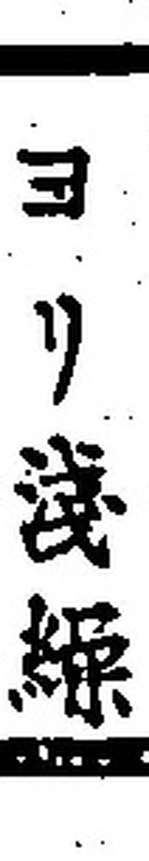ヨリ浅繰
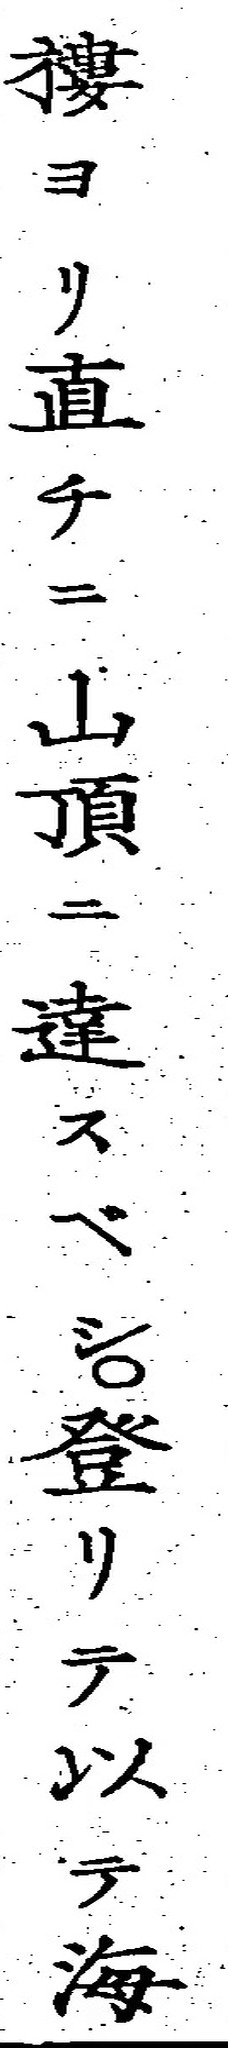楼ヨリ直チニ山頂ニ達スベシ。登リテ以テ海
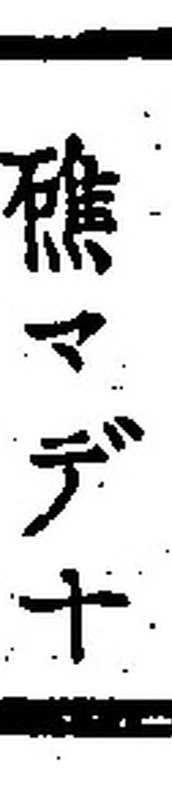礁マデ十
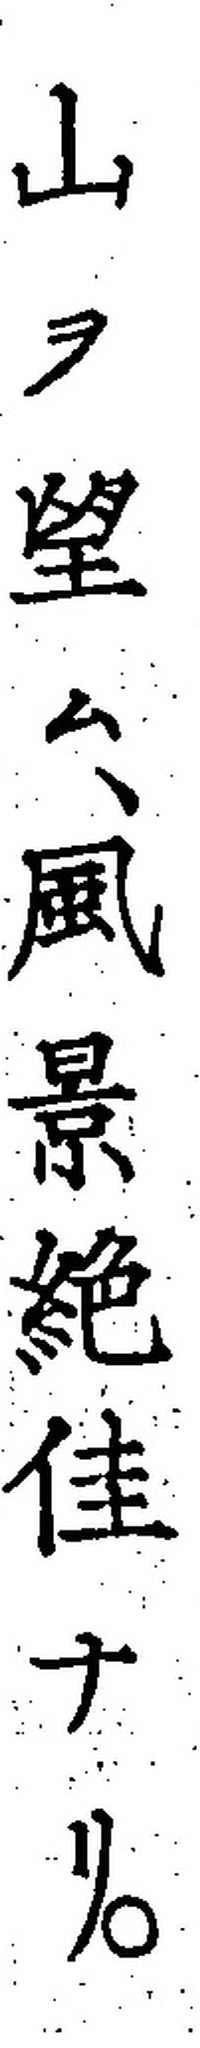山ヲ望ム、風景絶佳ナリ。
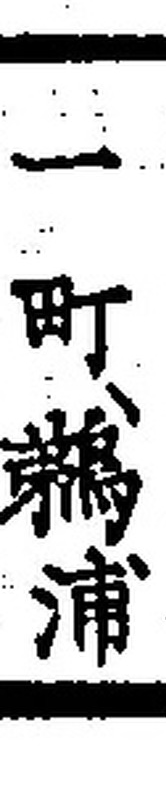一町、鵜浦
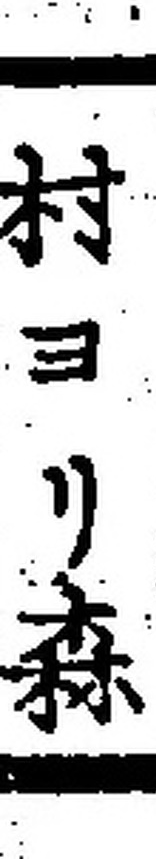村ヨリ森
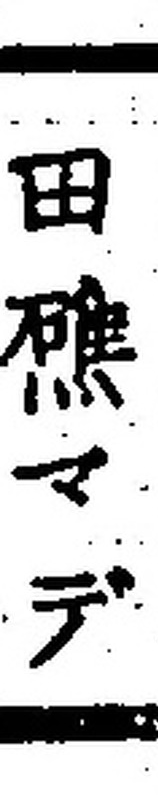田礁マデ
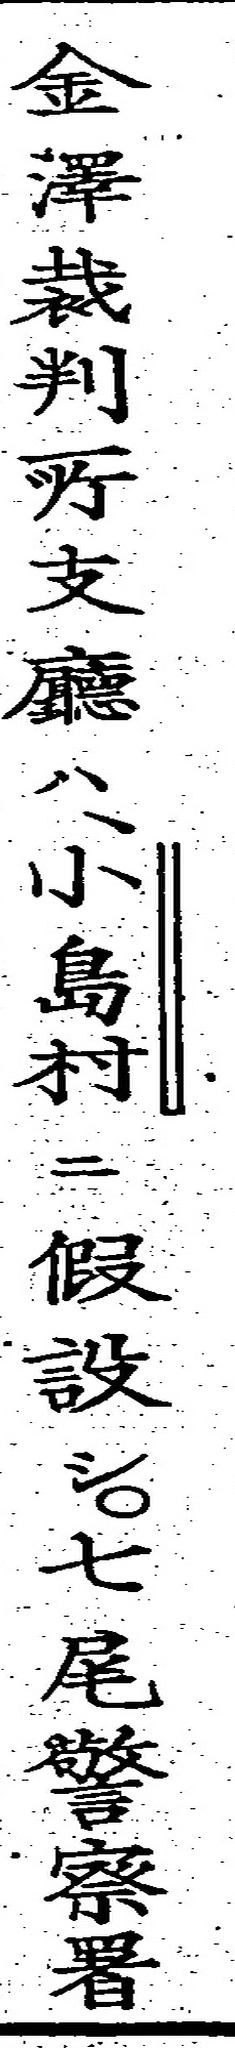金沢裁判所支庁ハ、小島村ニ仮設シ。七尾警察署
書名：能登地誌略
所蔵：国立国会図書館 National Diet Library, JAPAN
